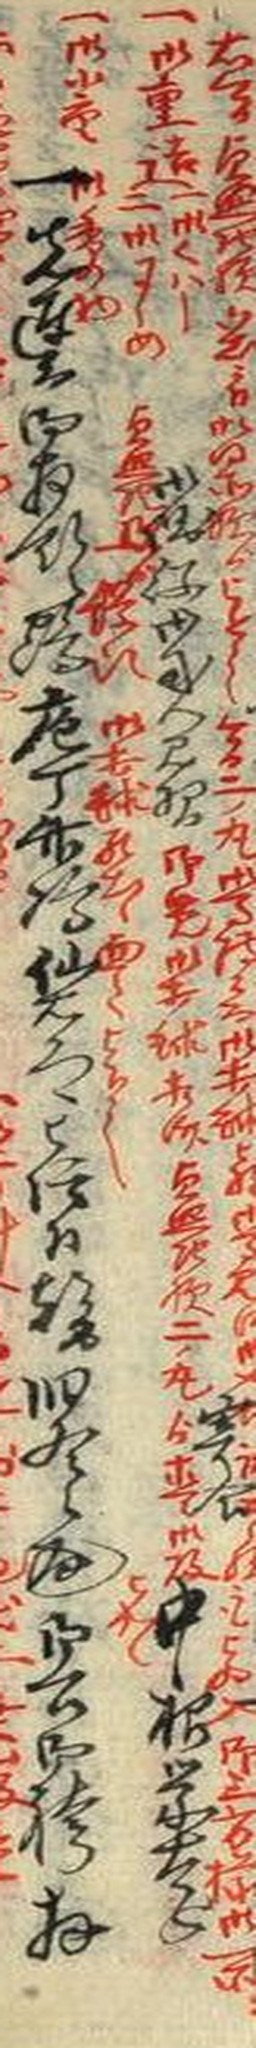一先達而御拝領之鶴庖丁竹嶋仙右衛へ被仰付都而旧冬之通御召御袴拝

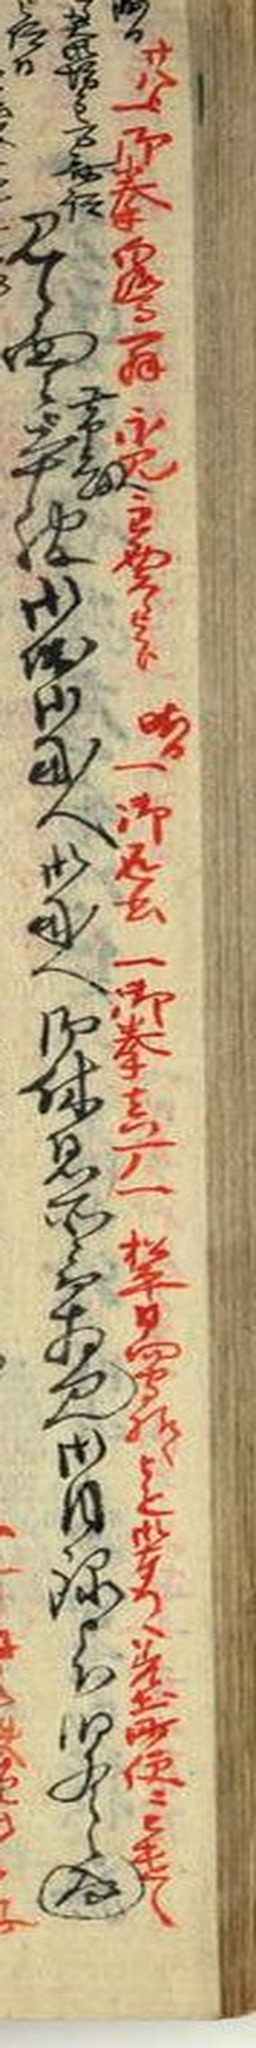見之面々帯剣平服御側御用人御用人御休息所ニ而拝見御目録被下旧冬之通
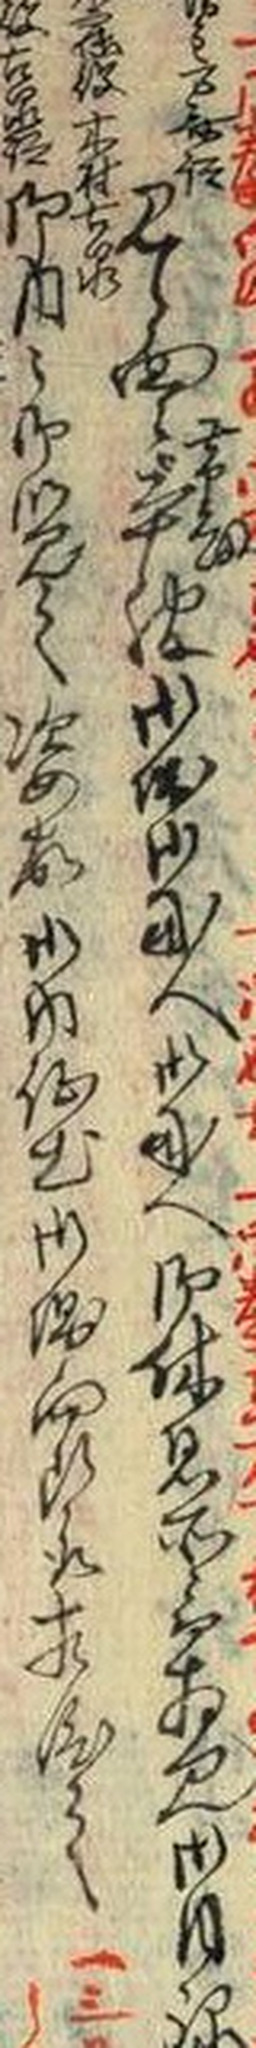御内々御覧之姿故御内証出御側向頭取相渡之
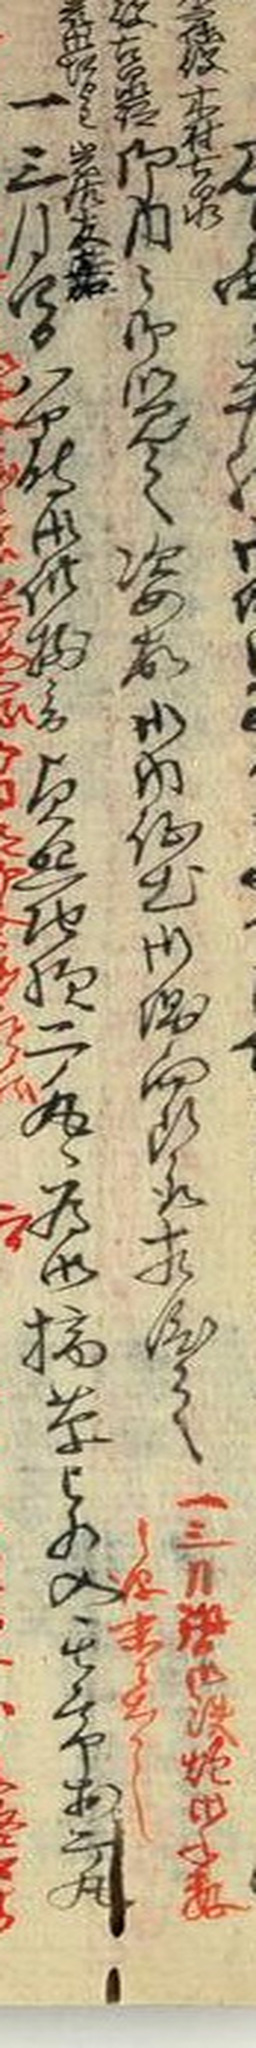一三月四日八半時御供揃ニ而貞照院様二ノ丸へ為摘草被為入其節於二ノ丸
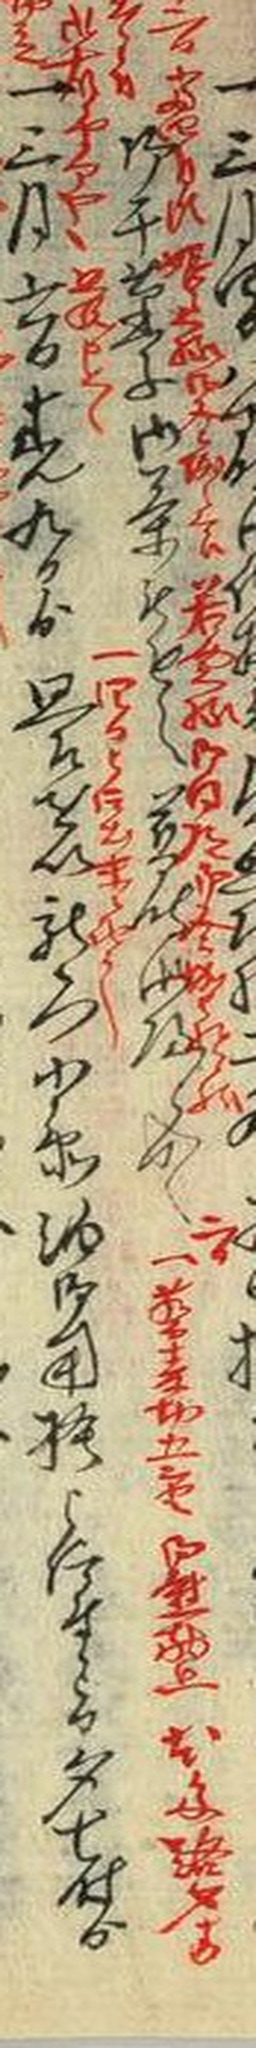一三月六日来ル九日ゟ思召を以新右衛門小兵衛泊御用捨被仰付候旨夕七時ゟ
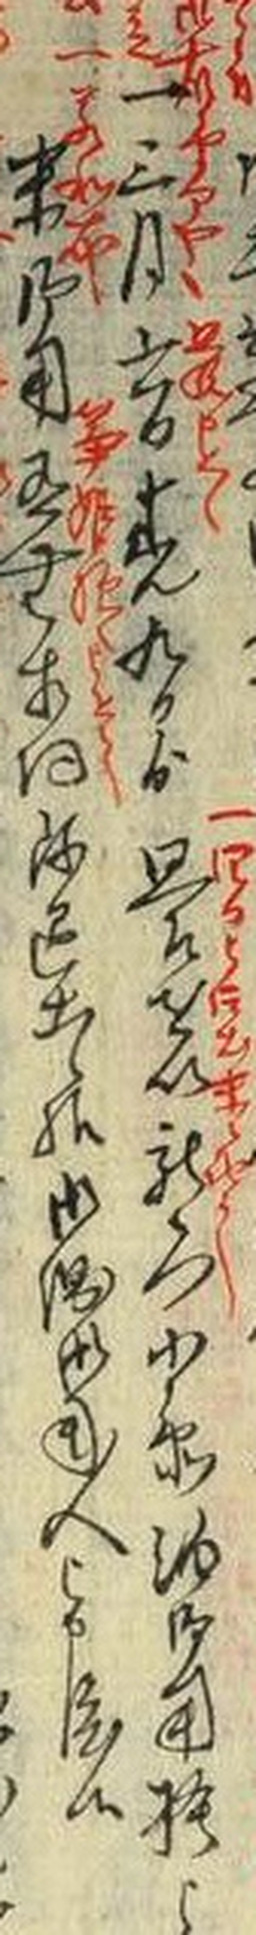末御用有無相伺致退出候様御側御用人被申渡候
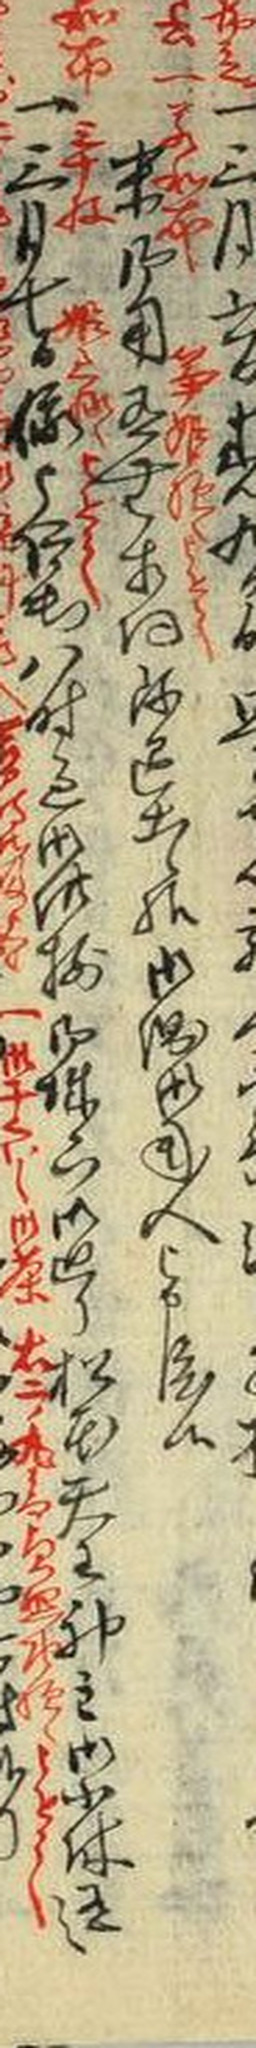一三月七日俄被仰出候八時過御供揃御城下御廻り松本天王神主御小休有之
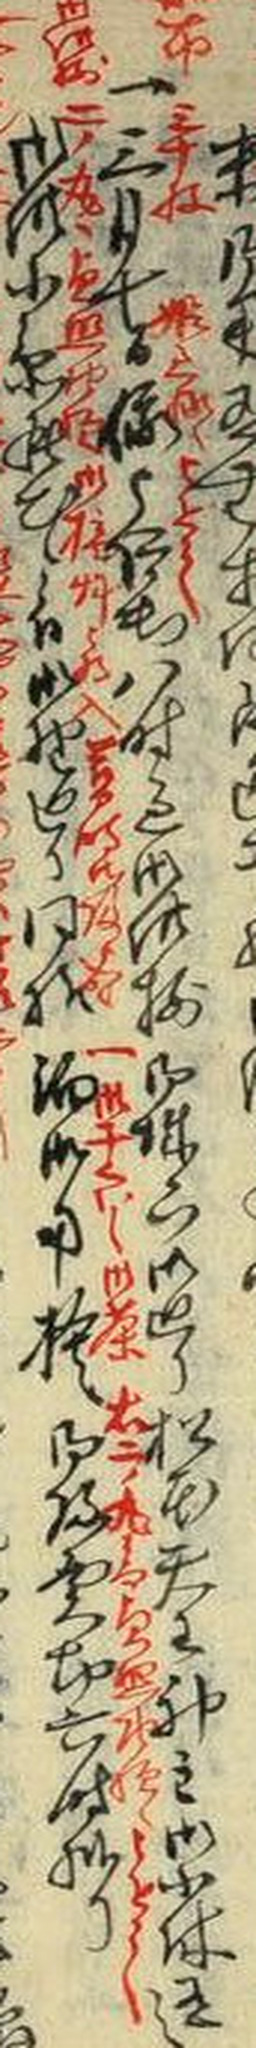御供小兵衛罷出候ニ付御野廻り同様泊御用捨御帰殿切六時掛り
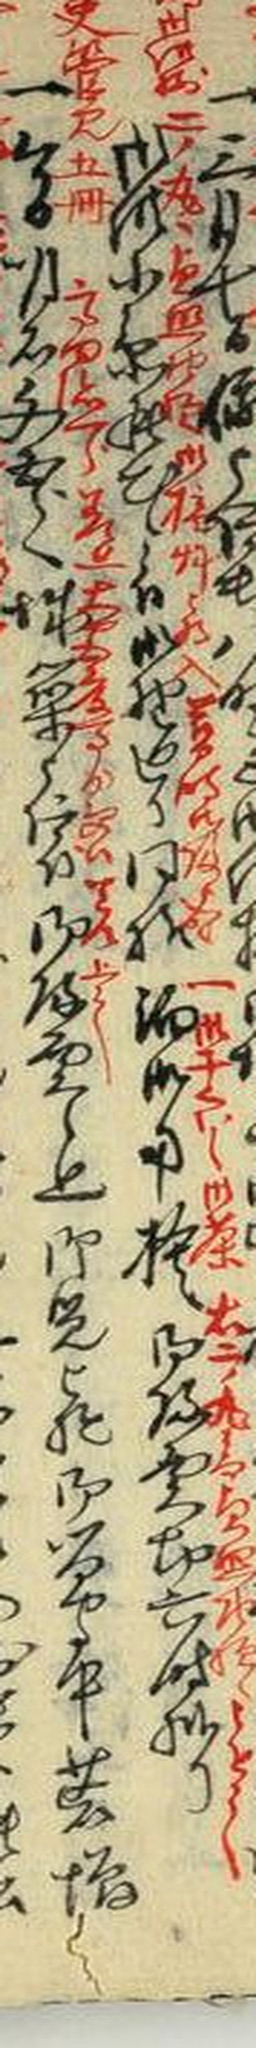一今日明石文五郎へ城築被仰付御帰殿之上御覧被遊御留守中荒増
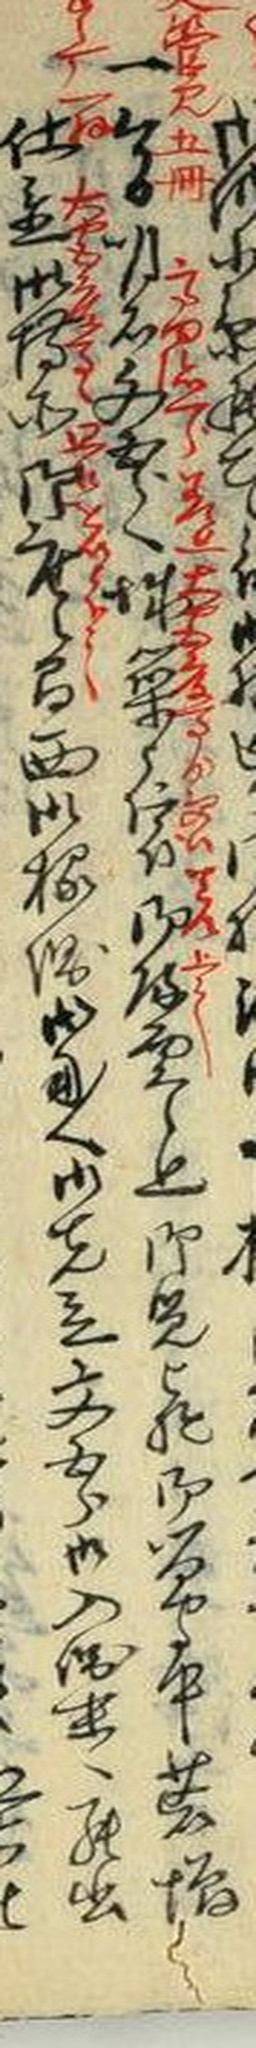仕置御場所御座之間西御縁側御用人御先立文五郎御入側御末へ罷出
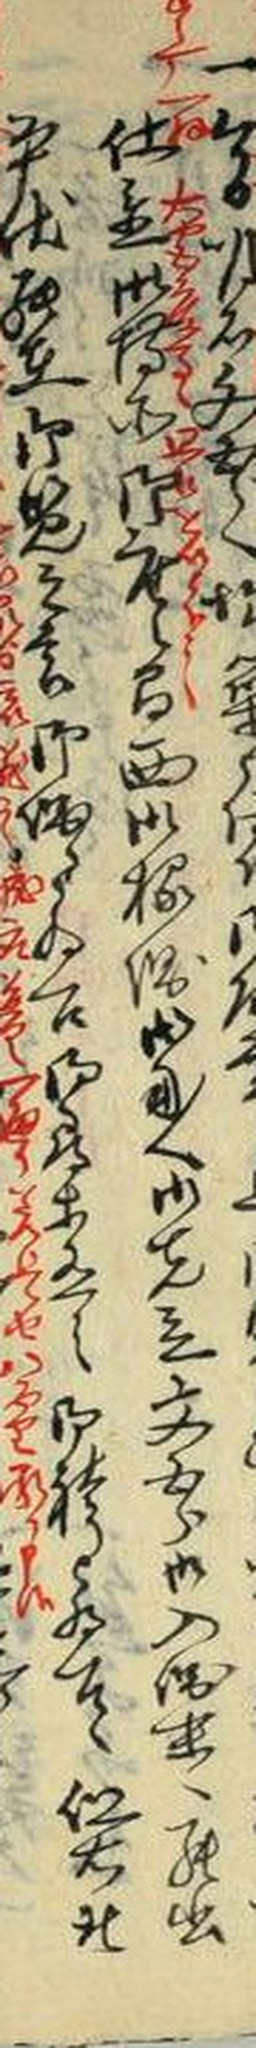平伏罷在御覧之節御側へ被為召御尋等有之御袴被為召候但右被
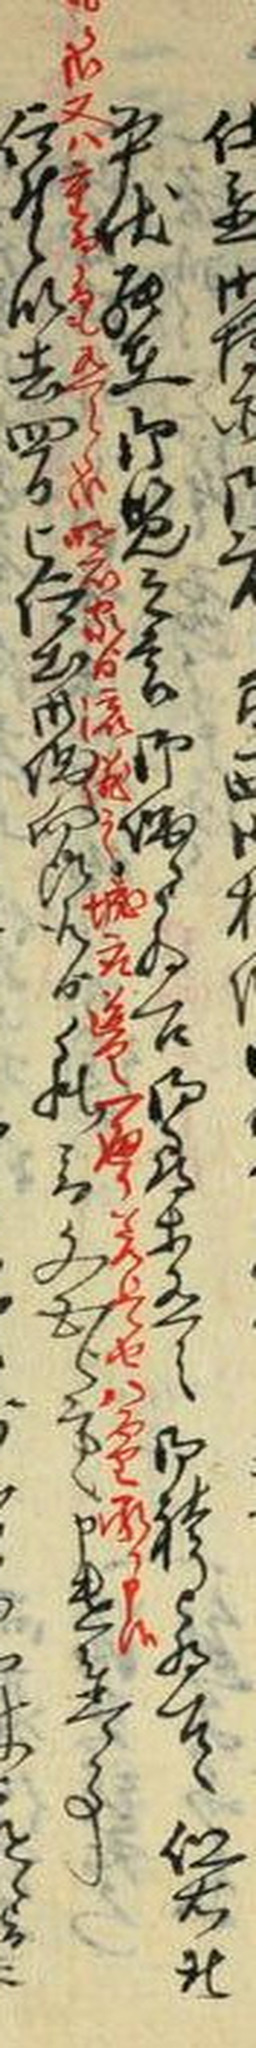仰付候段去四日被仰出御側向頭取ゟ手紙ニ而文五郎方へ申遣置候事
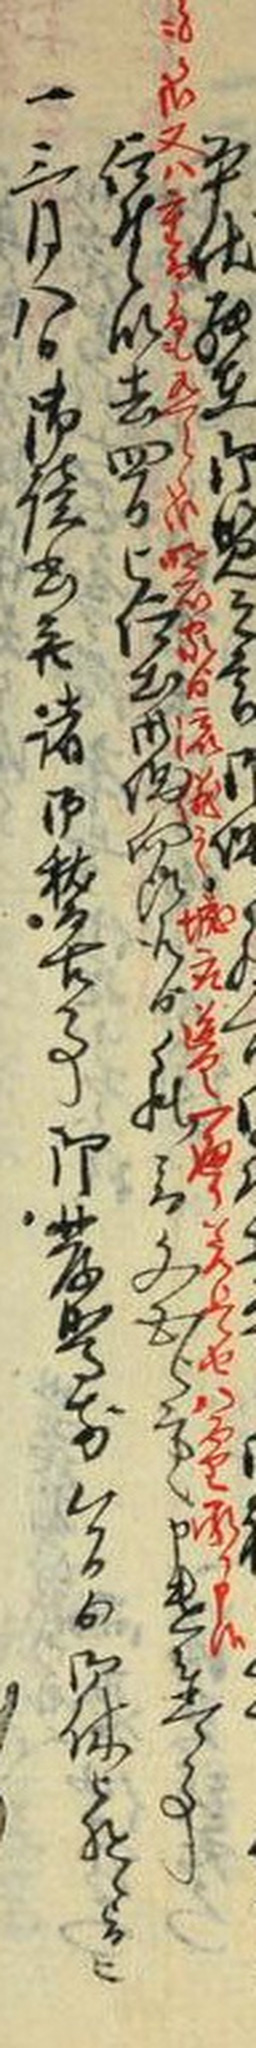一三月八日御読書幷諸御稽古事御発駕前今日ゟ御休被遊候旨被
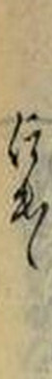仰出候
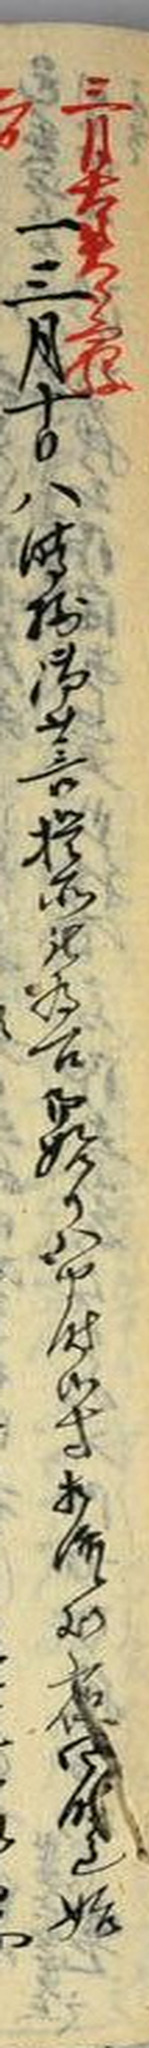一三月十日八時揃御菩提所被為召御始り八半時弐寸相済候処夜四時過始
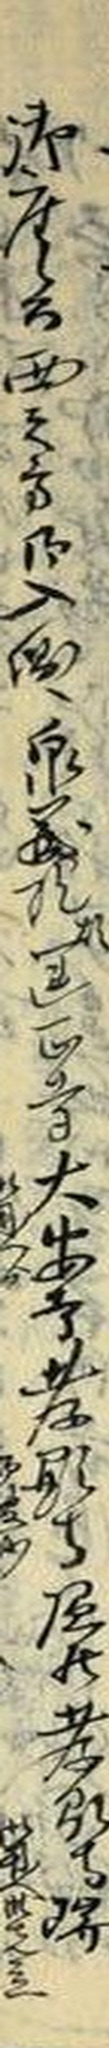御座之間西之方御入側へ泉蔵院煩運正寺大安寺孝顕寺隠居孝顕寺瑞
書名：少傅日録抄（斉承付側向頭取日記、在国）
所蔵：福井県文書館 Fukui Prefectural Archives
